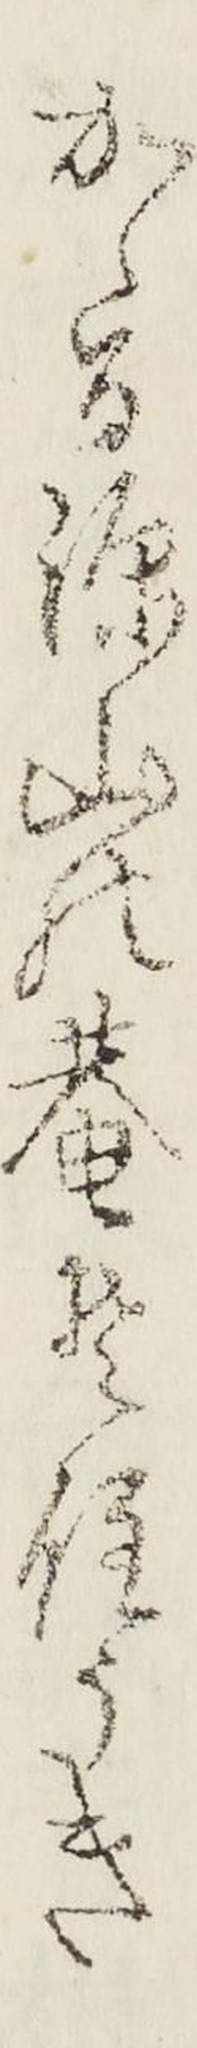かゝる深山の庵そ住うき
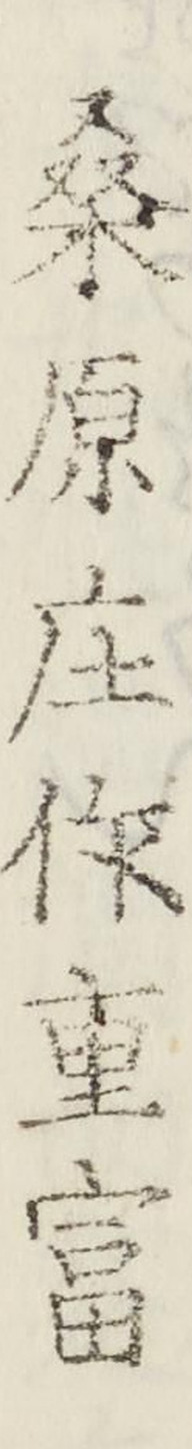に桑原庄作重富
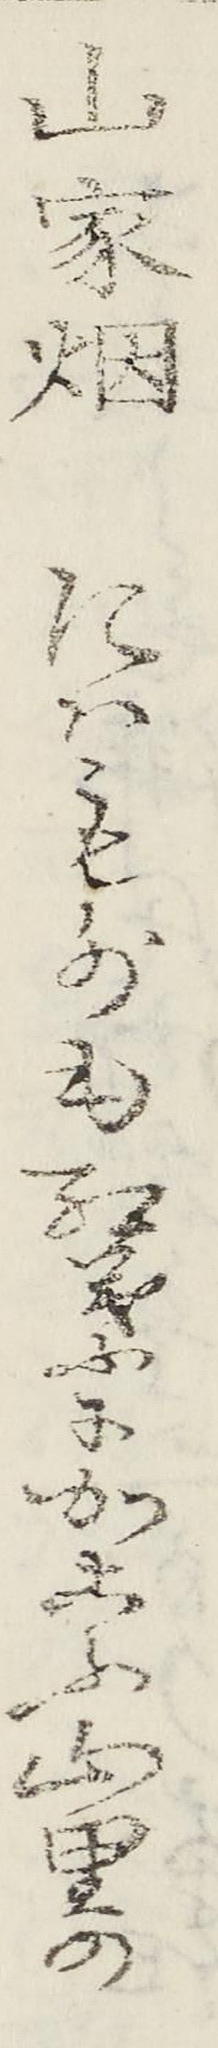山家煙にはも外も紅葉にかこふ山里の
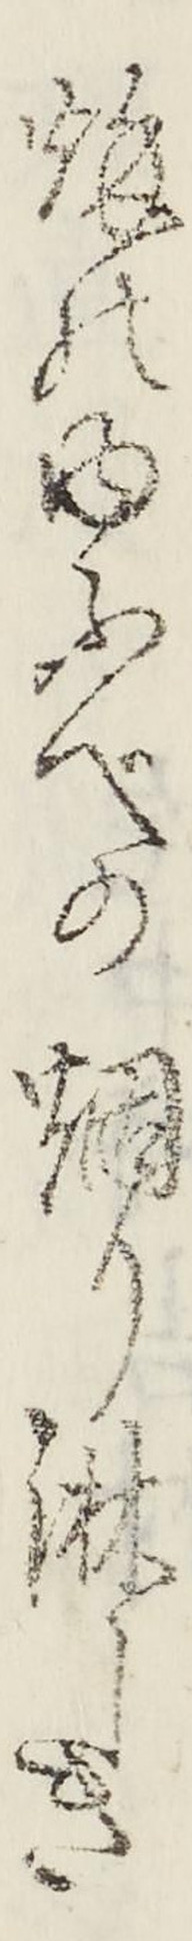秋のゆふべの煙り淋しき
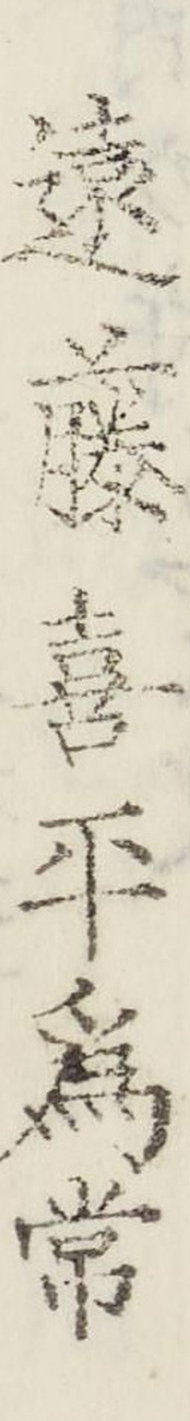よ遠藤喜平為常
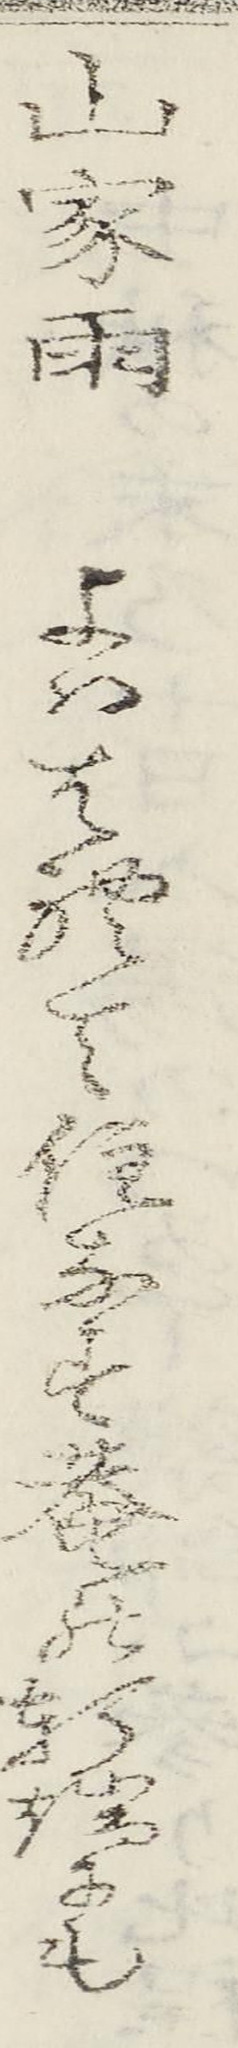山家雨よははれて住なす庵の軒端にも
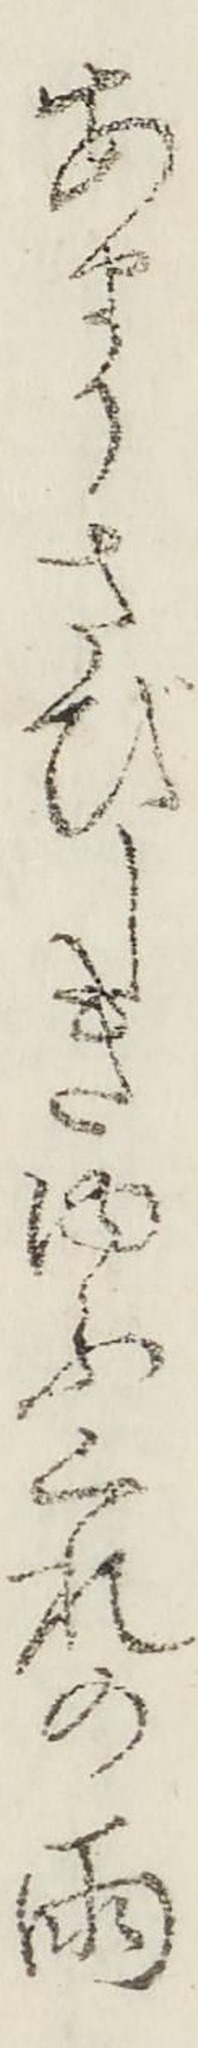あまりさびしきゆふくれの雨
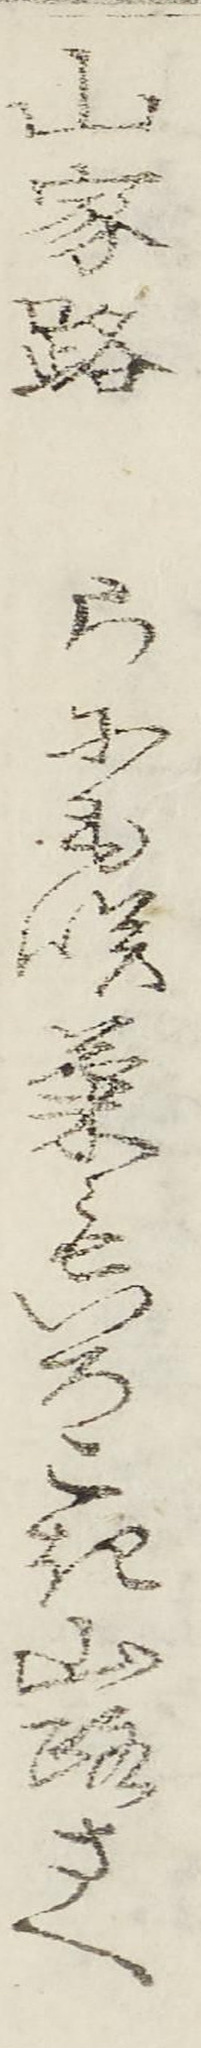山家路らにも咲菊もいろこき山路さへ
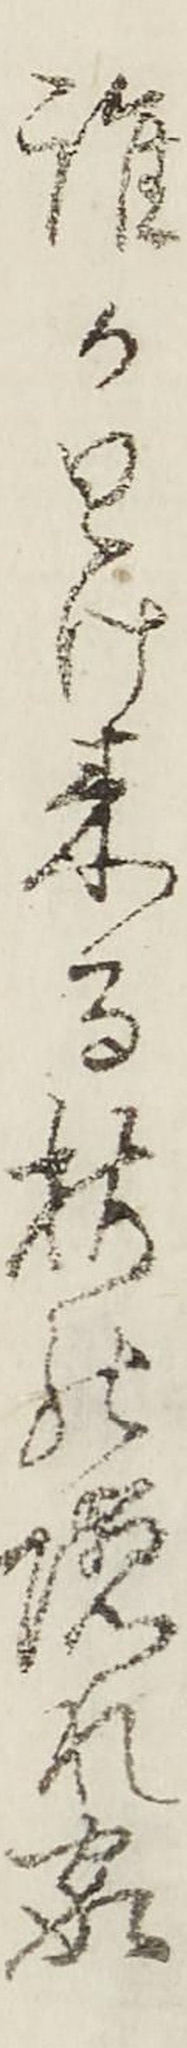誰かわけ来る秋の隠れ家

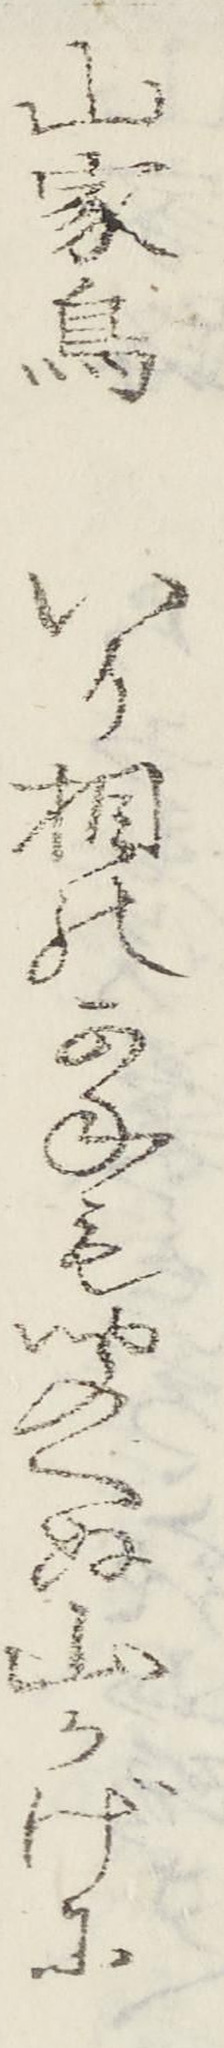山家鳥いり相のかねも聞へぬ山かげに
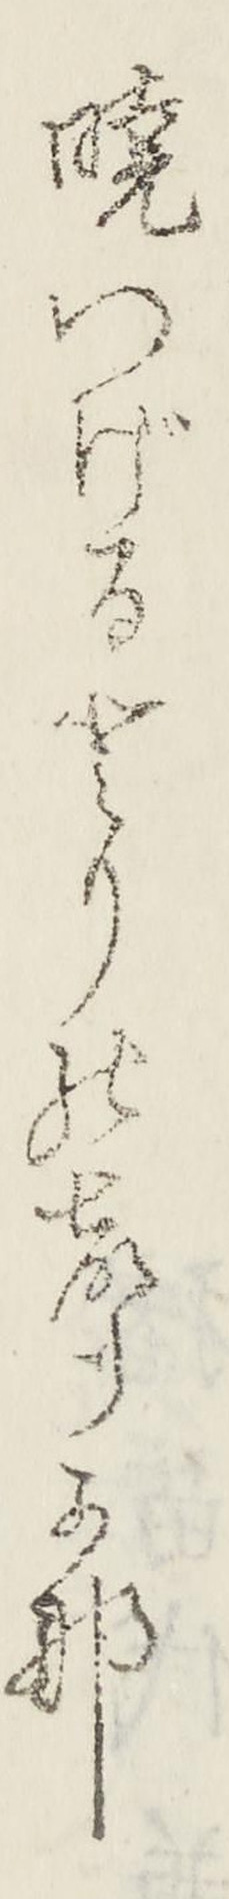暁つげるとりの声かな
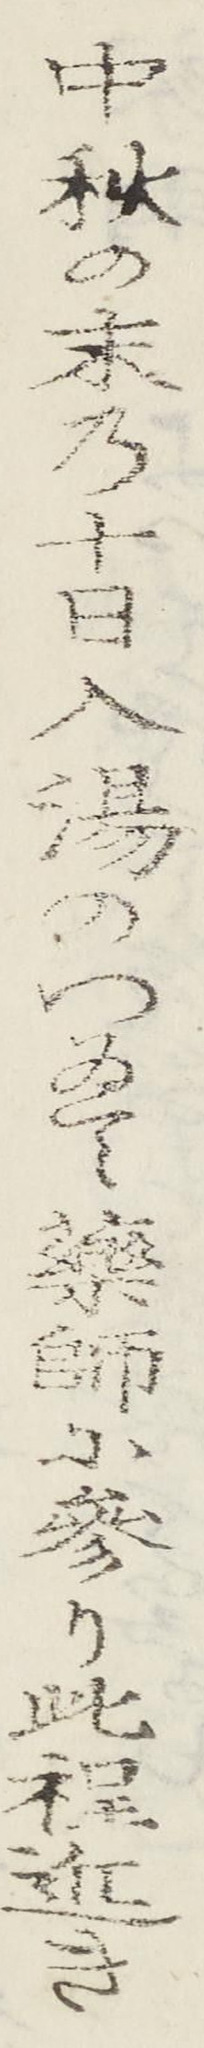中秋の末乃十日入湯のつゐて薬師に参り此程近き
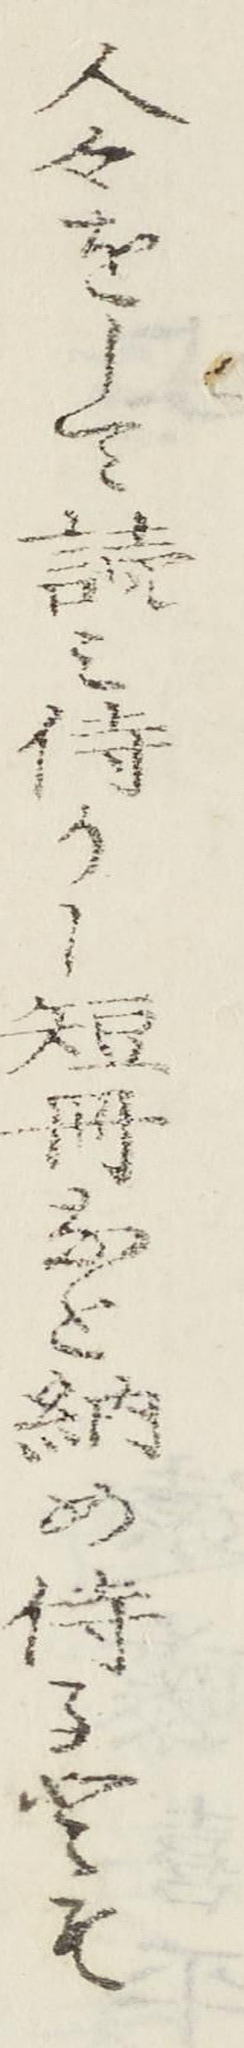人々をして読み侍りし短冊なと納め侍るとそ
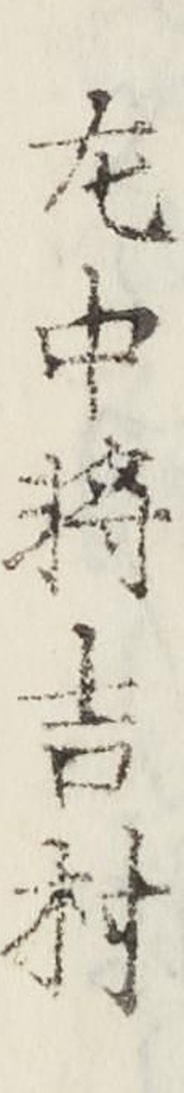左中将吉村
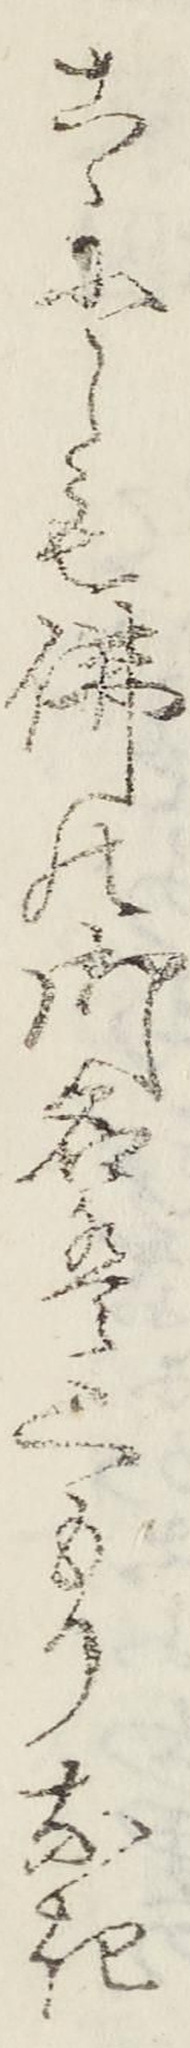こゝにしも仏の御名はくもりなき
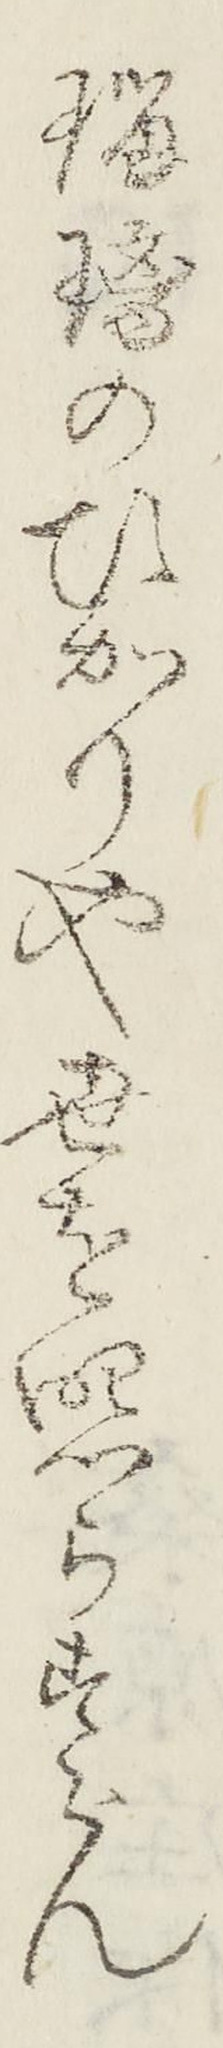瑠璃のひかりや世を照らすらん
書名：鎌先温泉由來記
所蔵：東京大学地震研究所図書室 Earthquake Research Institute Library, The University of Tokyo, JAPAN
